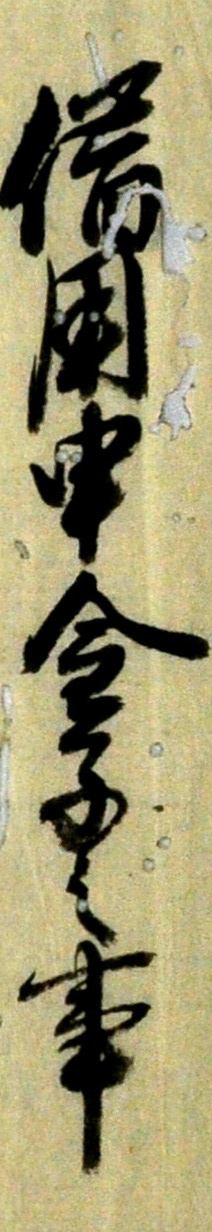借用申金子之事
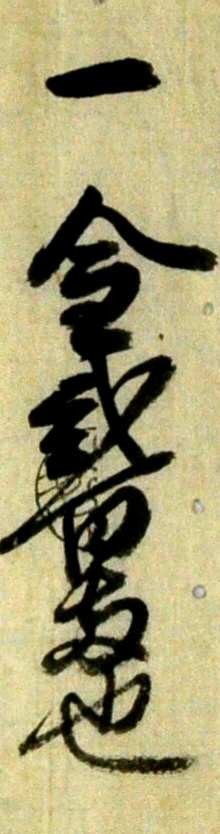一金弐百両也
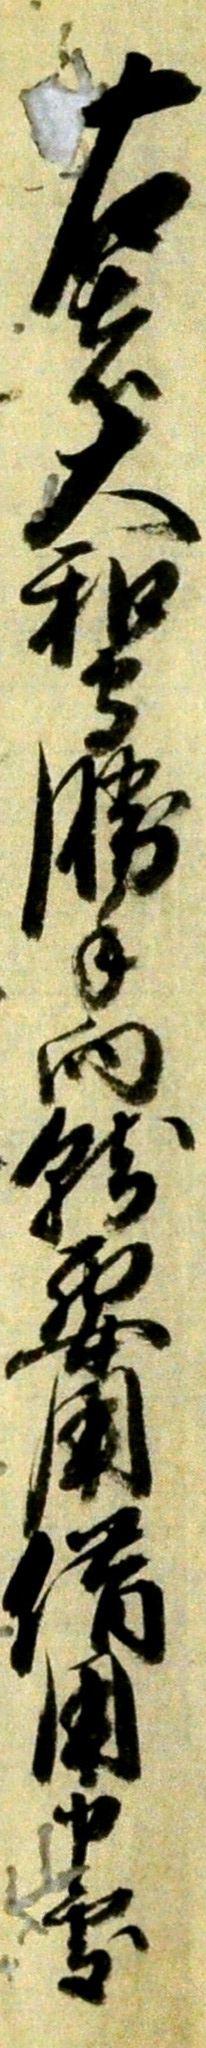右は大和守勝手向就要用借用申処
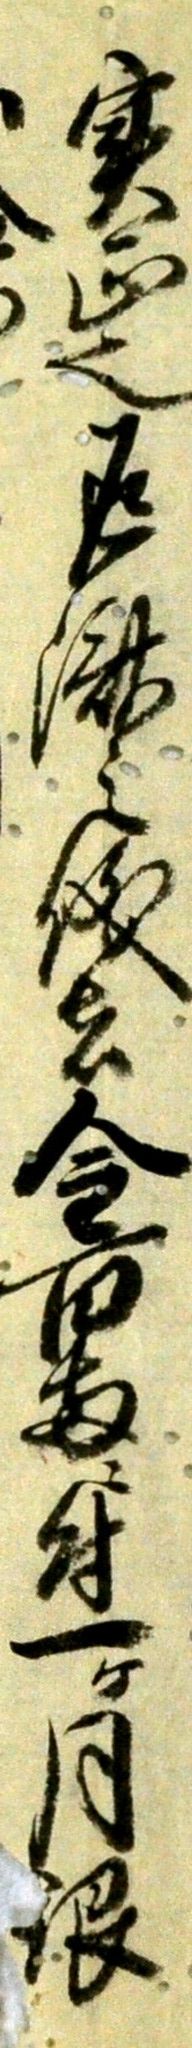実正也返済之儀は金百両に付一ヶ月銀
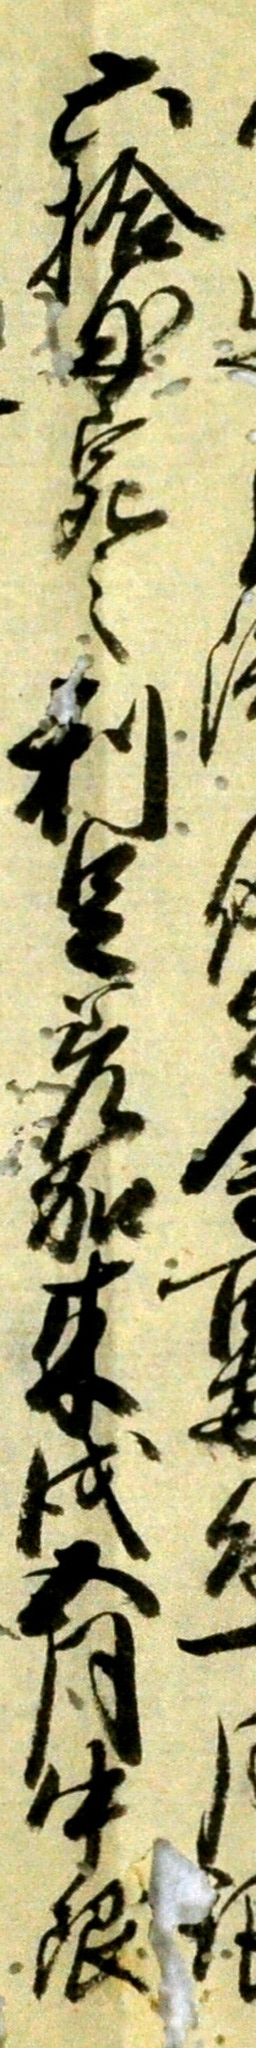六拾匁宛之利足差加来戌五月中限
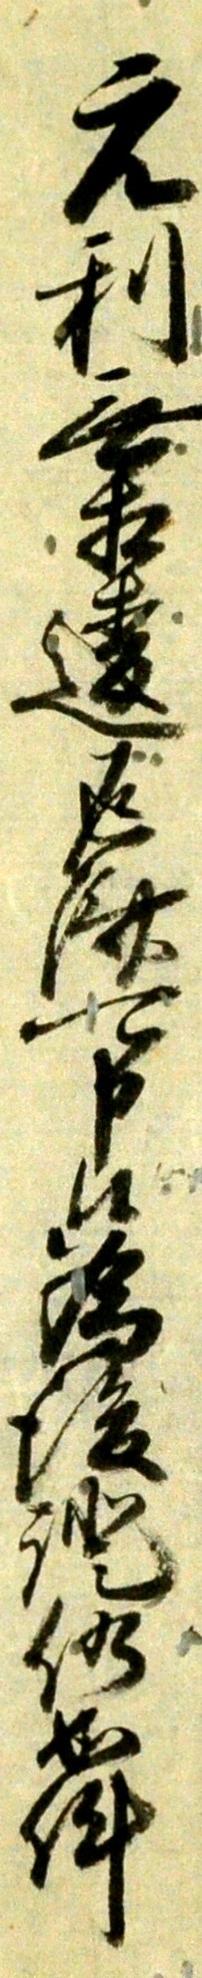元利無相違返済可申候為後証仍如件
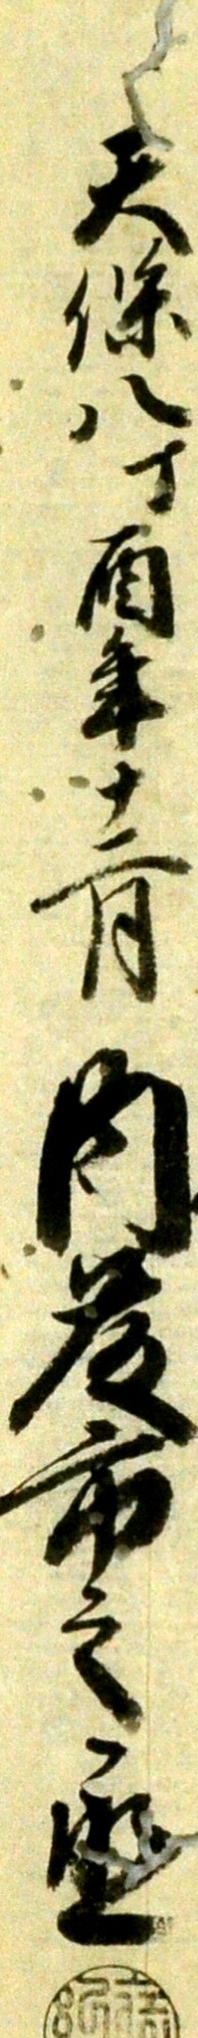天保八丁酉年十二月内藤市之丞㊞
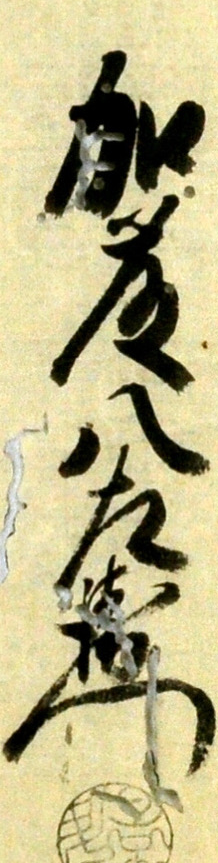加藤八左衛門㊞
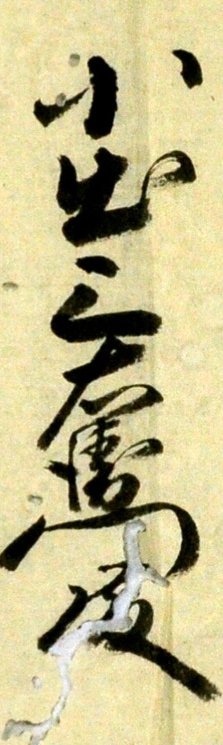小出三右衛門殿
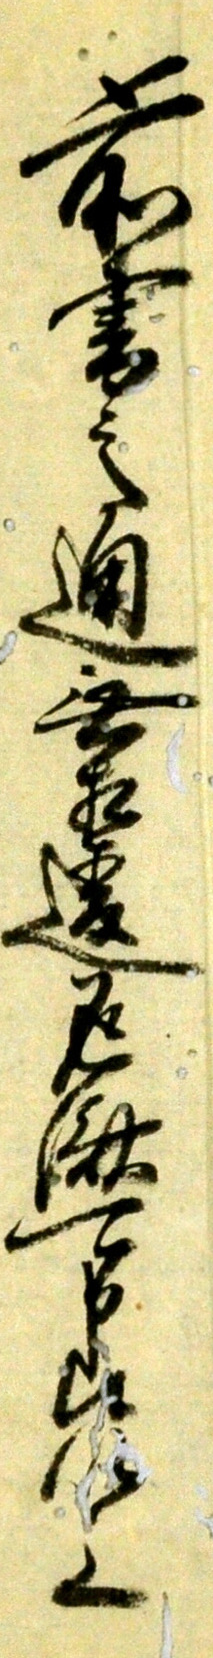前書之通無相違返済可申候以上
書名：借用申金子之事
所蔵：伊那市立高遠町図書館・合同会社AMANE
